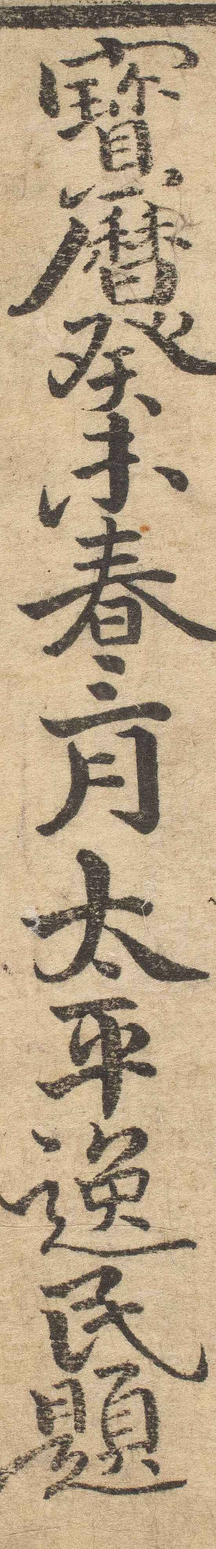宝暦癸未春三月太平逸民題
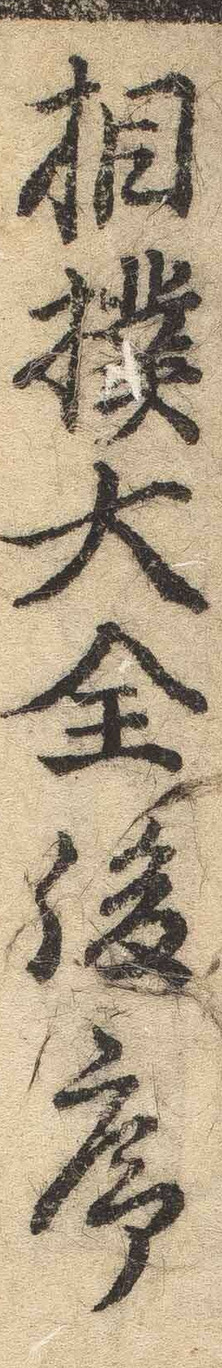相撲大全後序

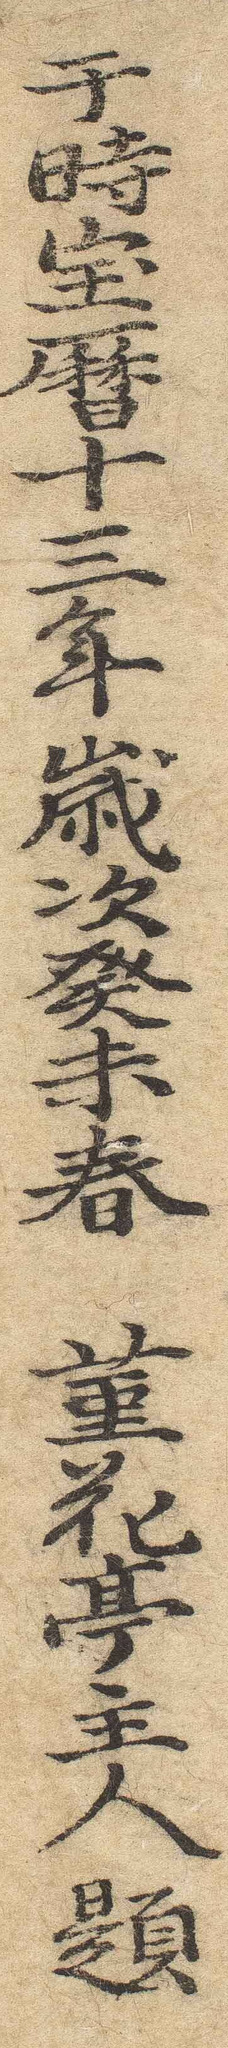于時宝暦十三年歳次癸未春菫花亭主人題
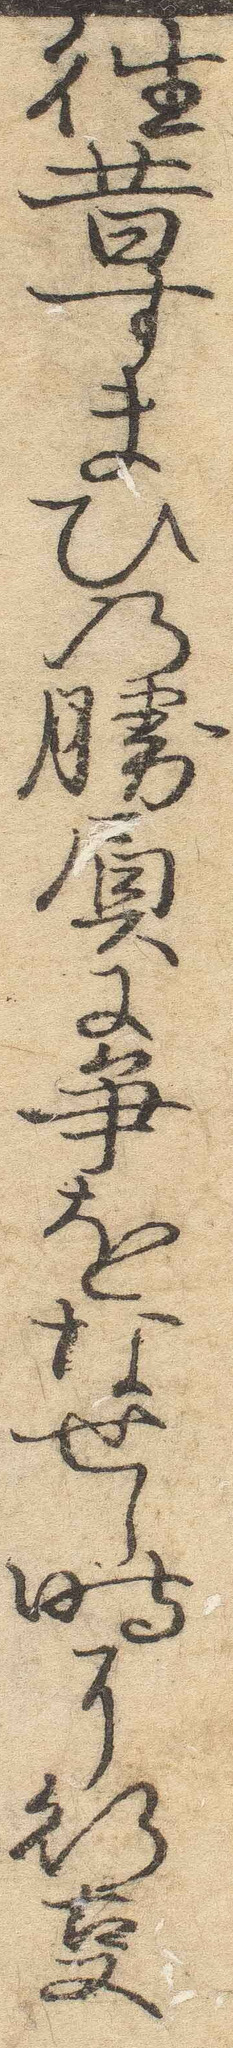往昔すまひの勝負に争をなせし時に行事
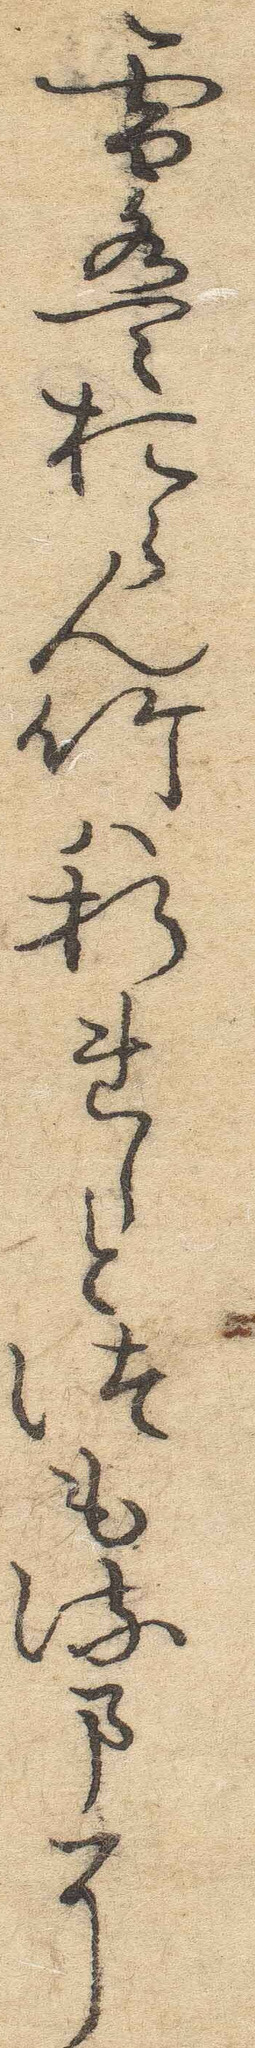雪はおらん竹は折れしとつもるまに
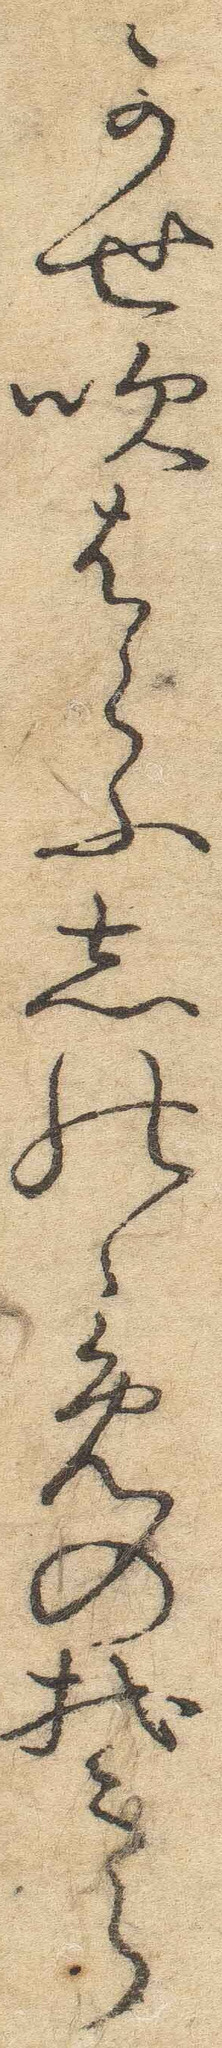かせふ吹はらふしのゝめのそら
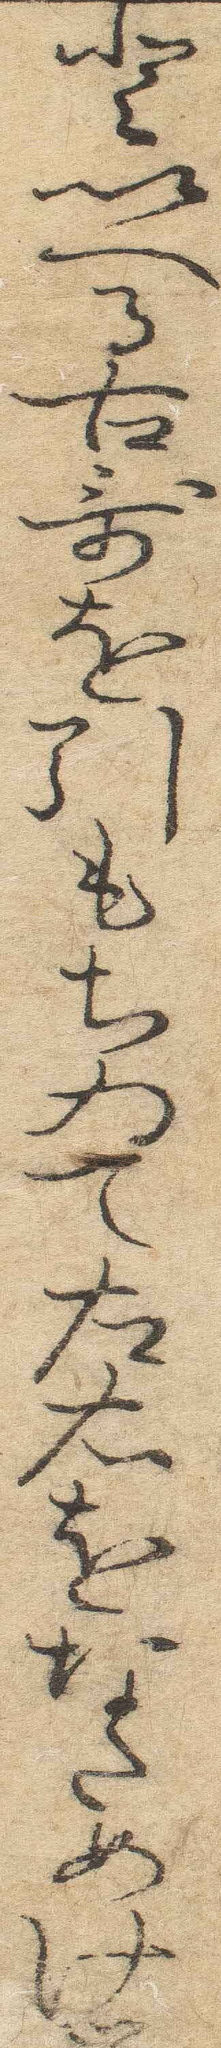といへる古哥を引もちゐて左右をなためける
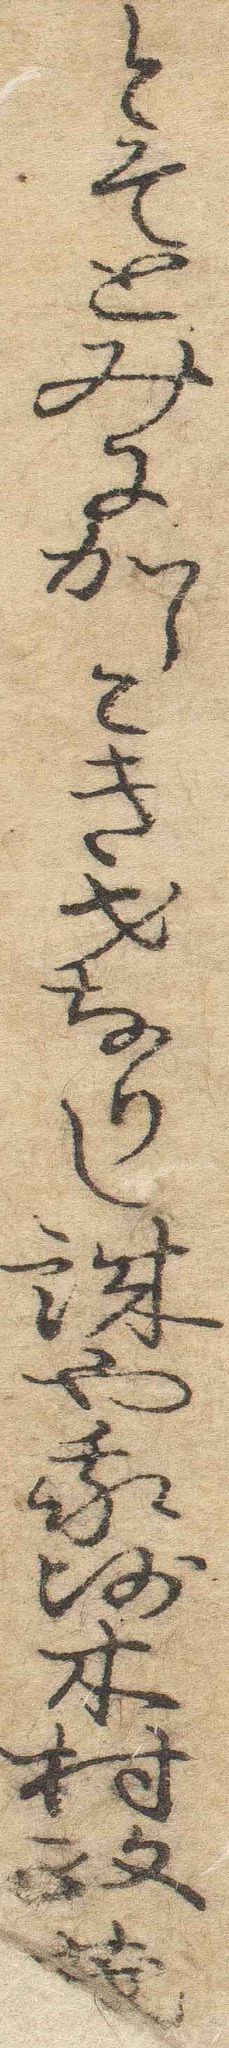とそとみにかしこき才なりし誠や我師木村政茂
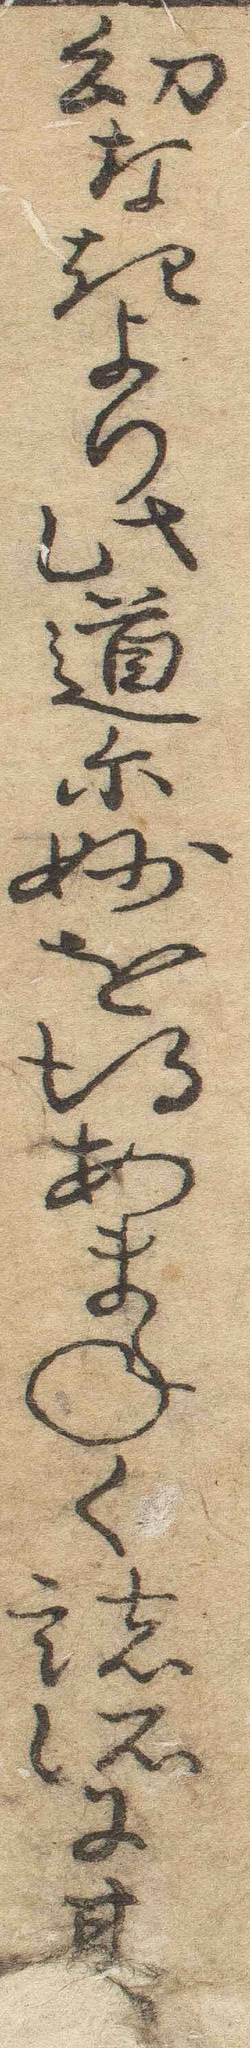幼なきより此道に妙を得あまねく諸所に其
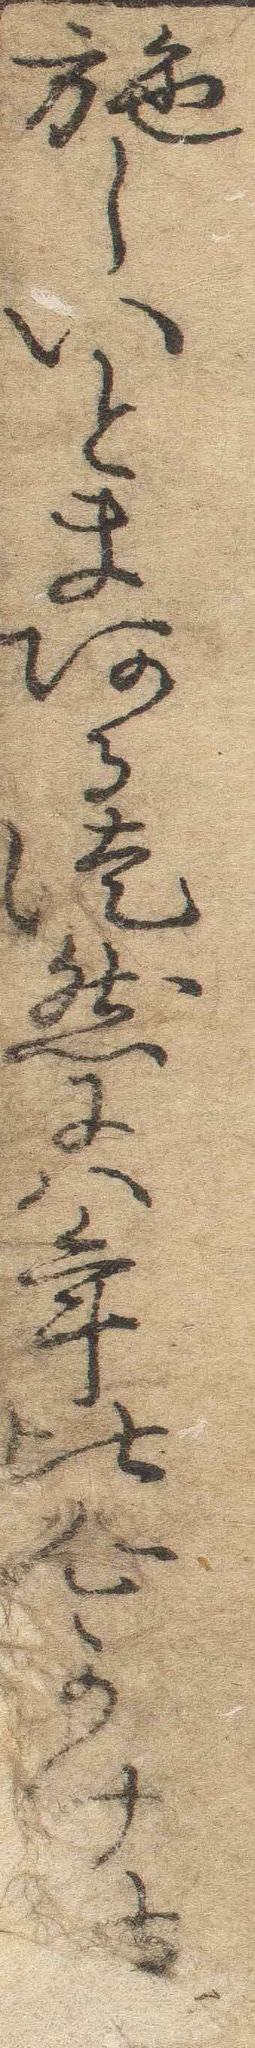施しいとまある徒然には年比心かけ

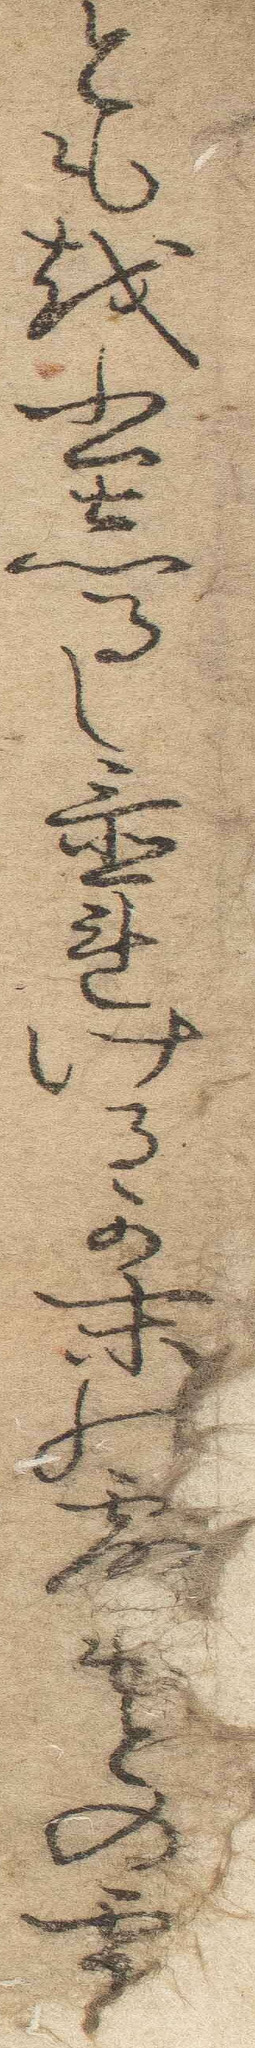ともを書しるし置れけるか末の露もとの雫
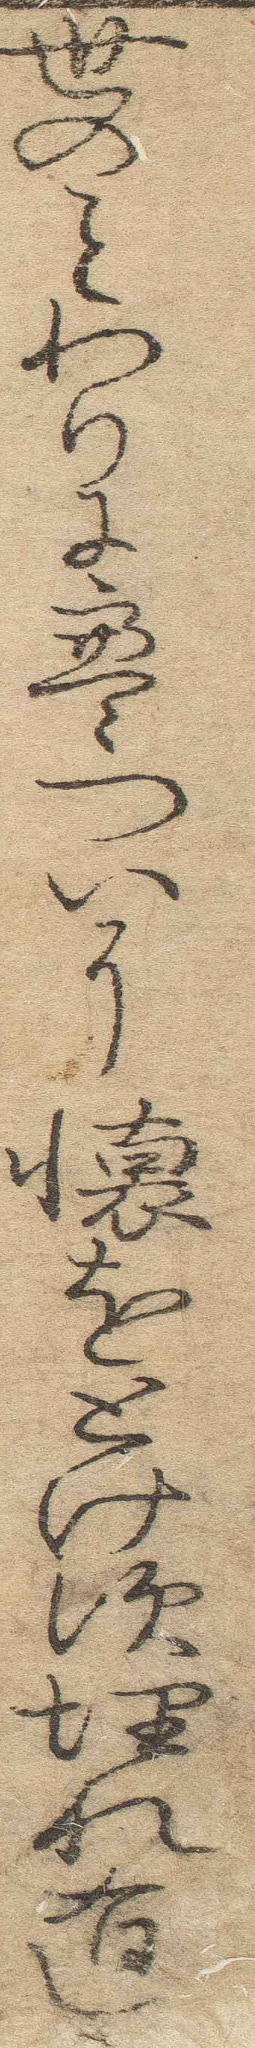世のことわりにはついに懐をとけす埋れ有し
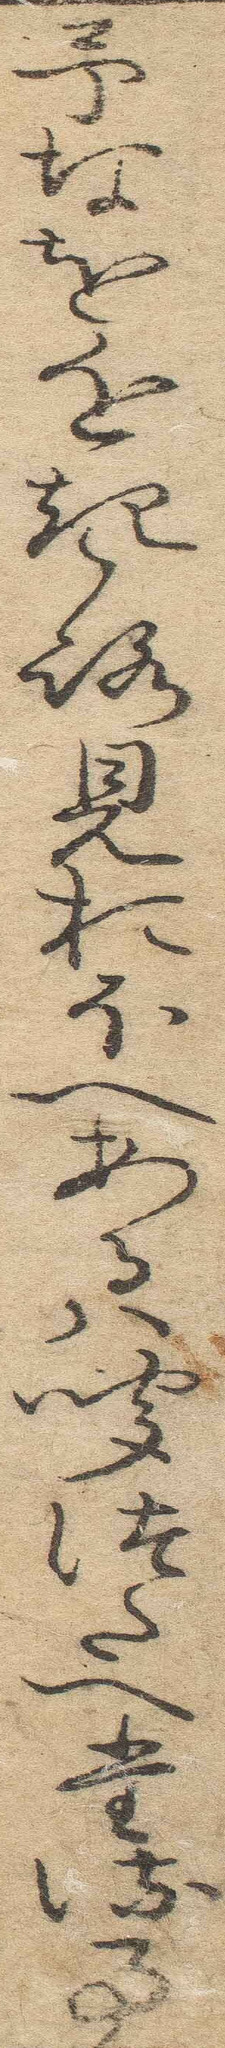予なを近きころ見おほへあるは聞つたへたる事
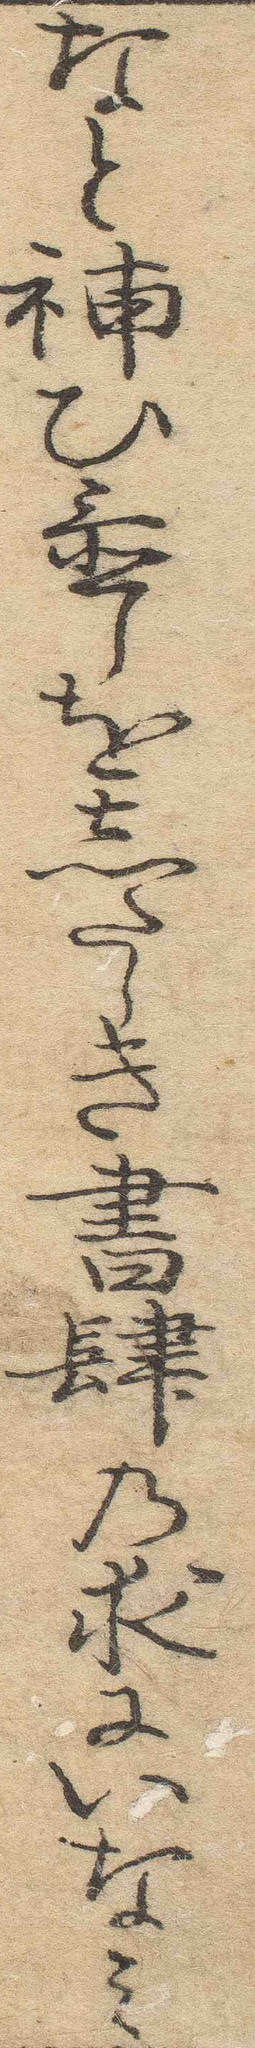なと補ひ置しをしたしき書肆の求にいなみ
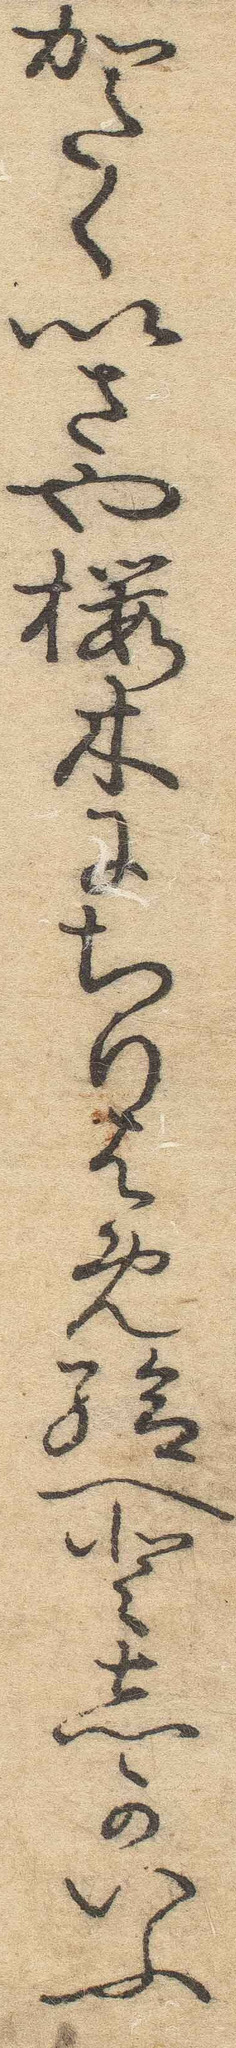かたくいさや桜木にちりはめ給へとしかいふ
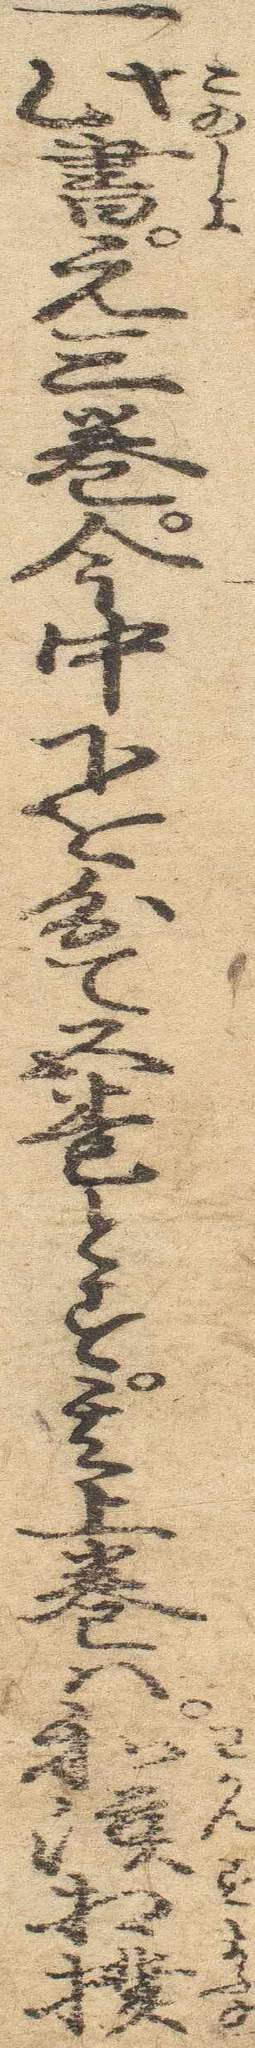一此書。元三巻。今中下を分て五巻とす。其上巻は。和漢相撲
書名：古今相撲大全
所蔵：東京学芸大学附属図書館 国文学研究資料館
